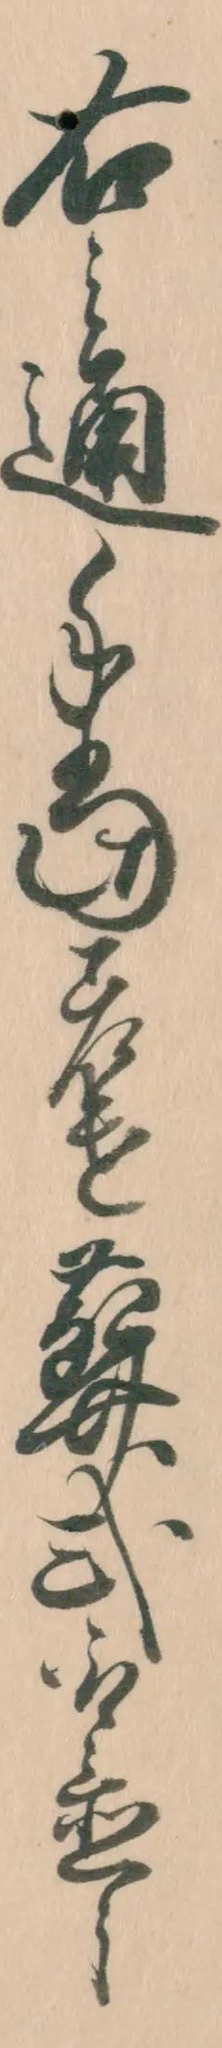右之通手当差遣葬式取置之
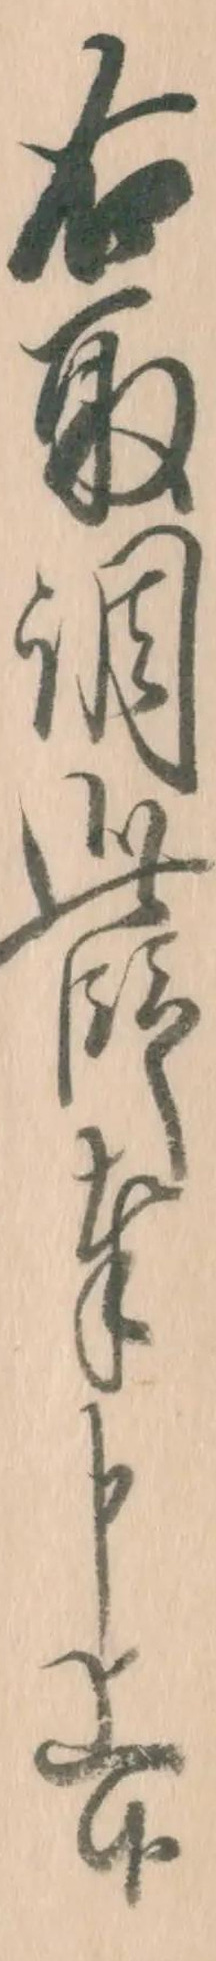右取調此段奉申上候
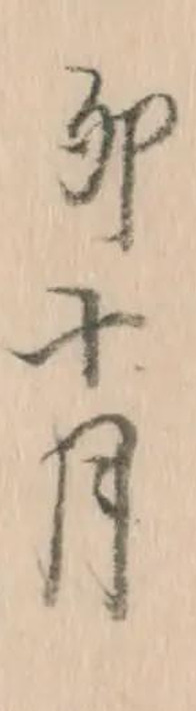卯十月

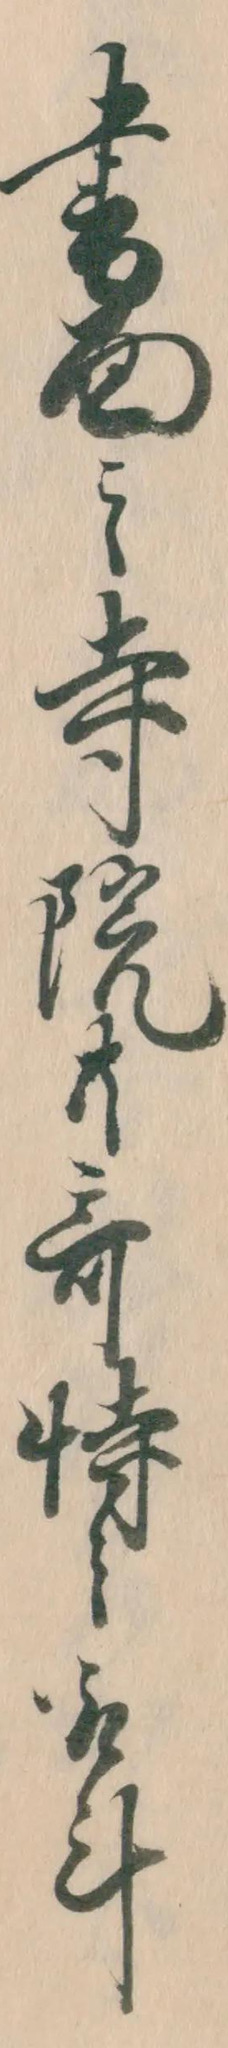書面之寺院共奇特之取計
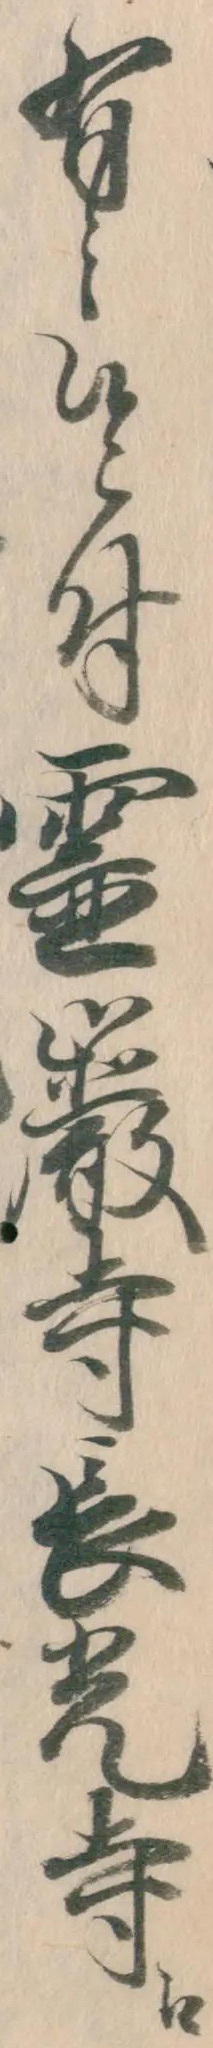有之候ニ付霊巌寺長光寺え
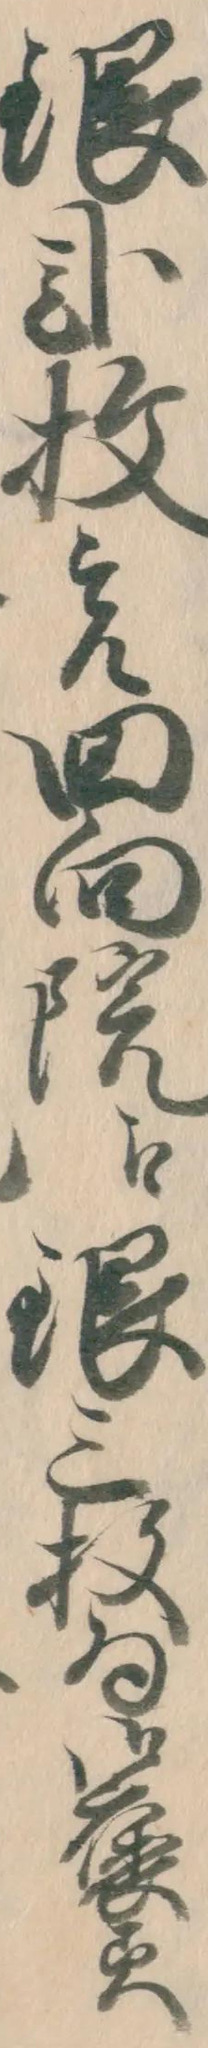銀弐枚宛回向院え銀三枚為御褒美
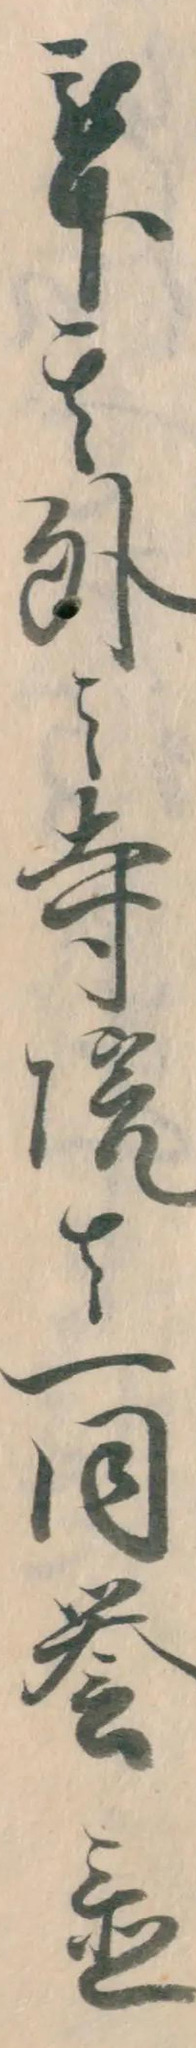被下其外之寺院は一同誉置

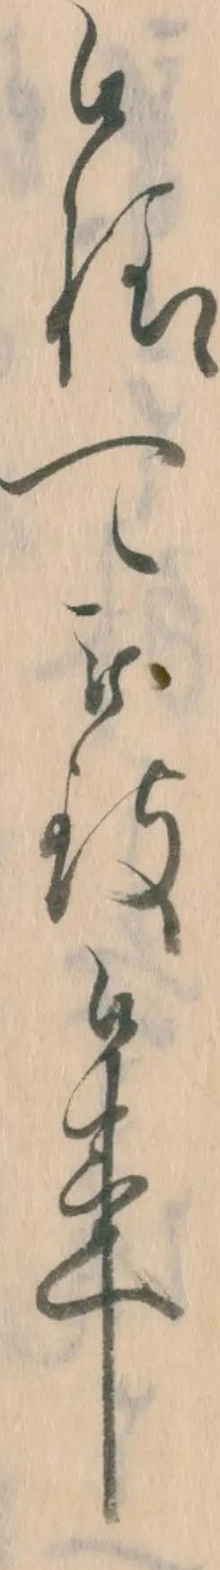候様可被致候事
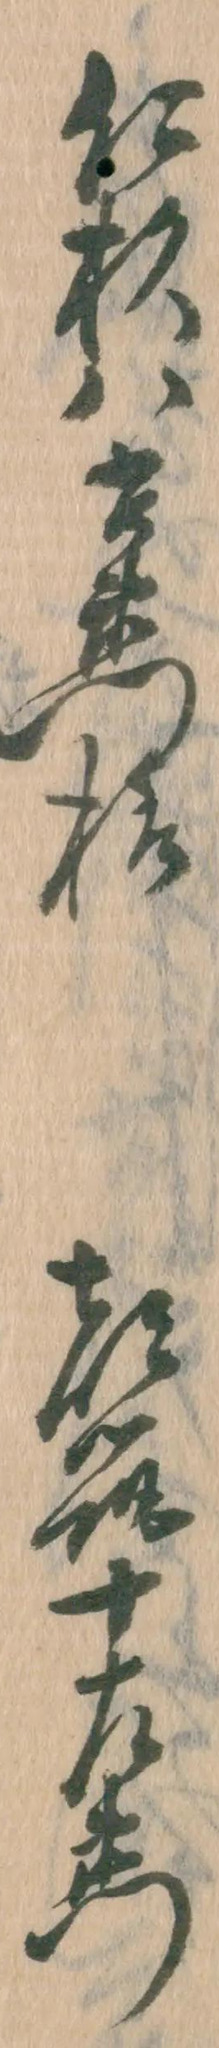仁杉八右衛門様都筑十左衛門
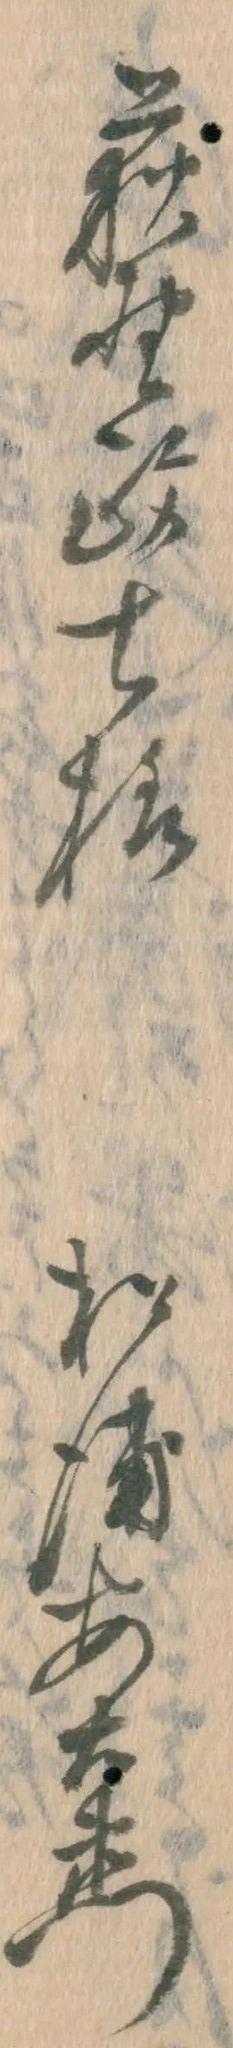荻野政七様松浦安右衛門
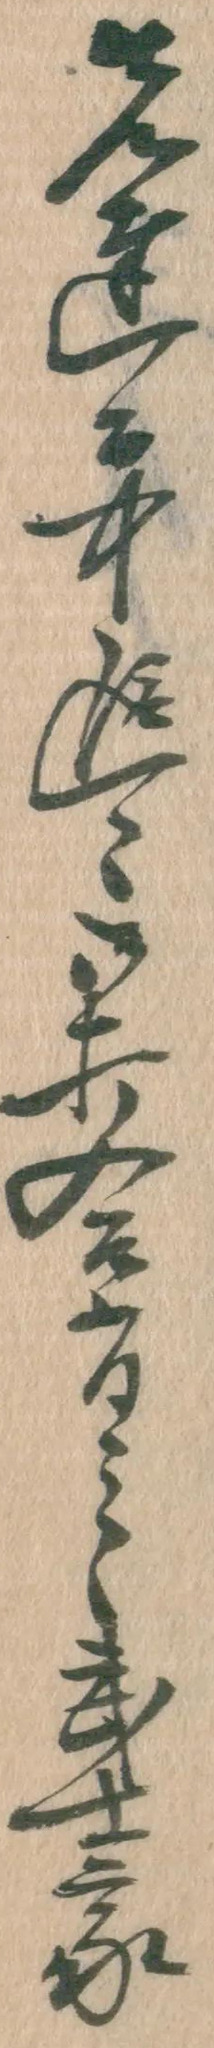先達而中追々御打合有之候武士家
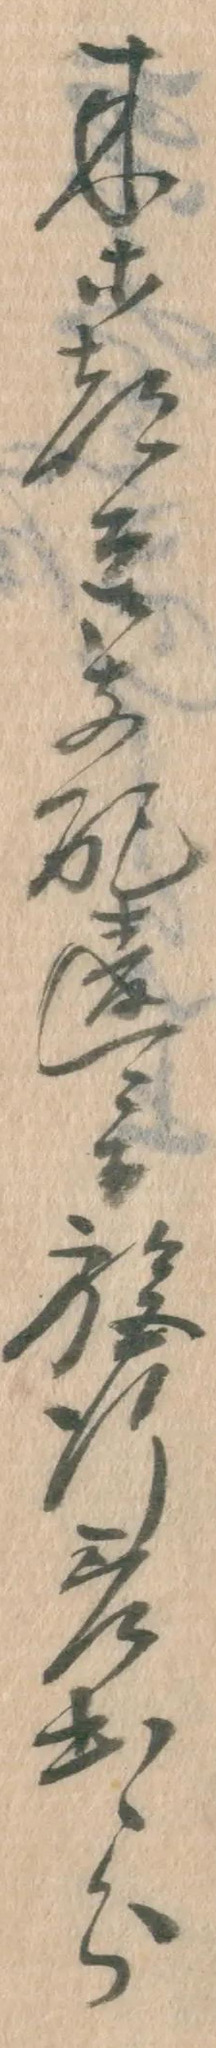来等都而御支配違ニ而施行差出候分
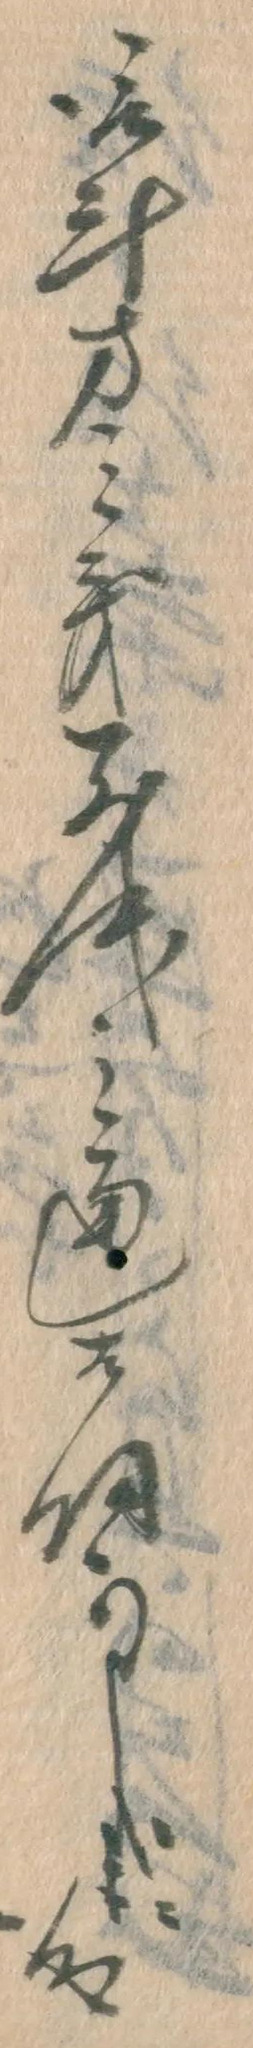取計方之義別紙之通相伺可申哉ニ御座候
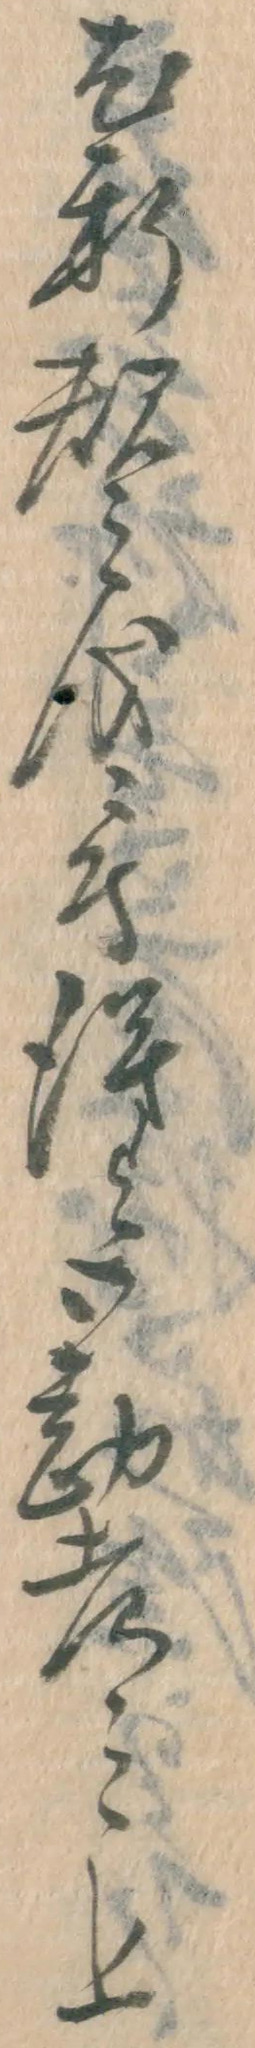尤新規之儀ニ付得と御勘考之上

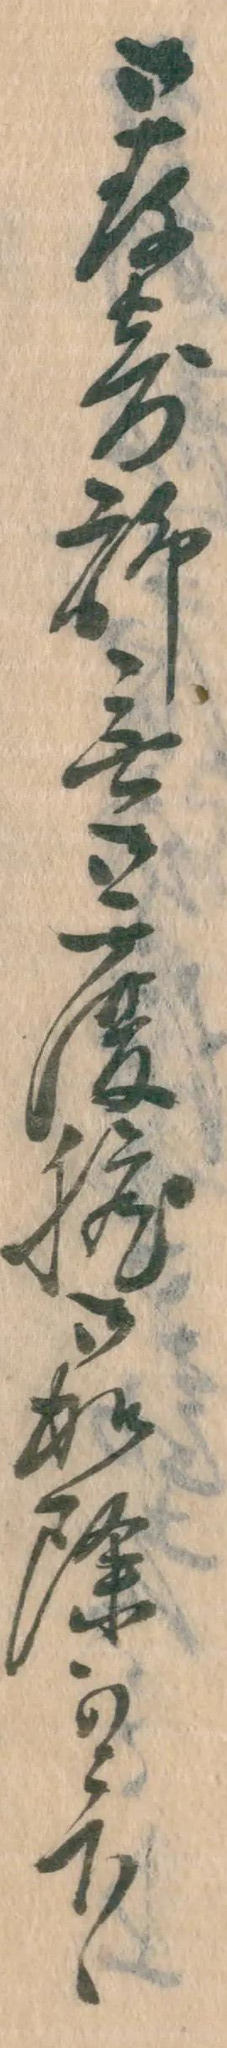御存寄聊無御覆臓御加除可被下候
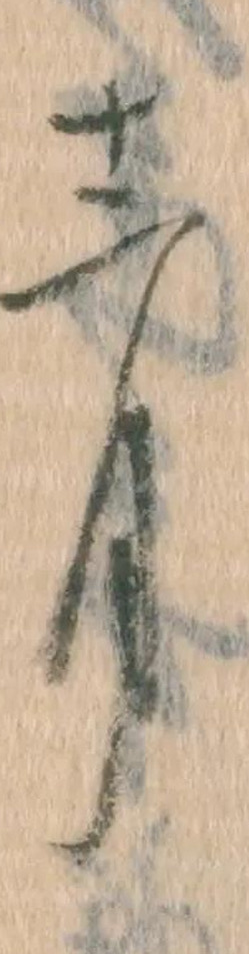十二月
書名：武家方并寺院等ニテ施差出候一件
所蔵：国立国会図書館 National Diet Library, JAPAN
